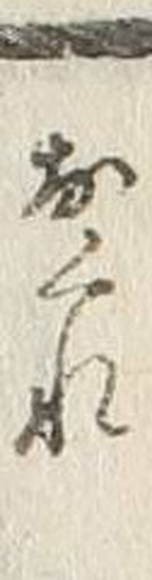おくれ
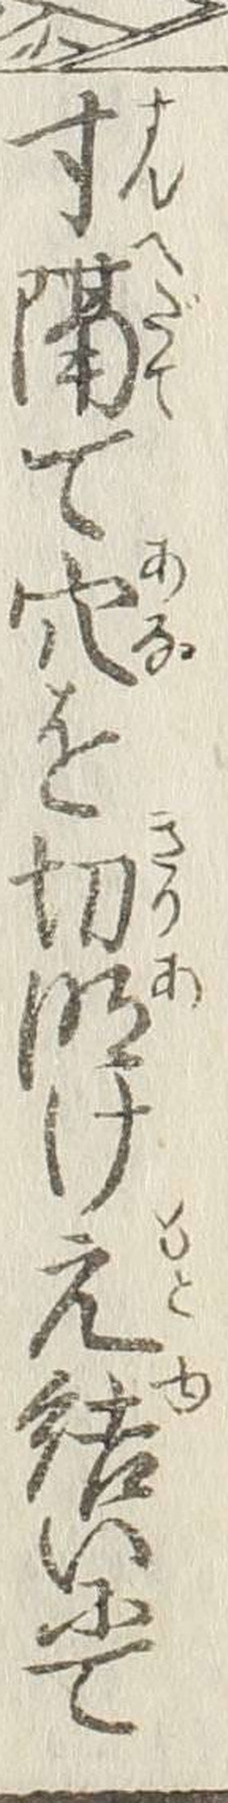寸隔て穴を切明け元結いにて
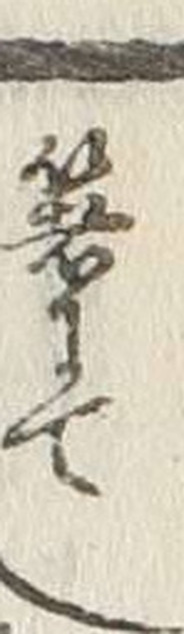箸にて
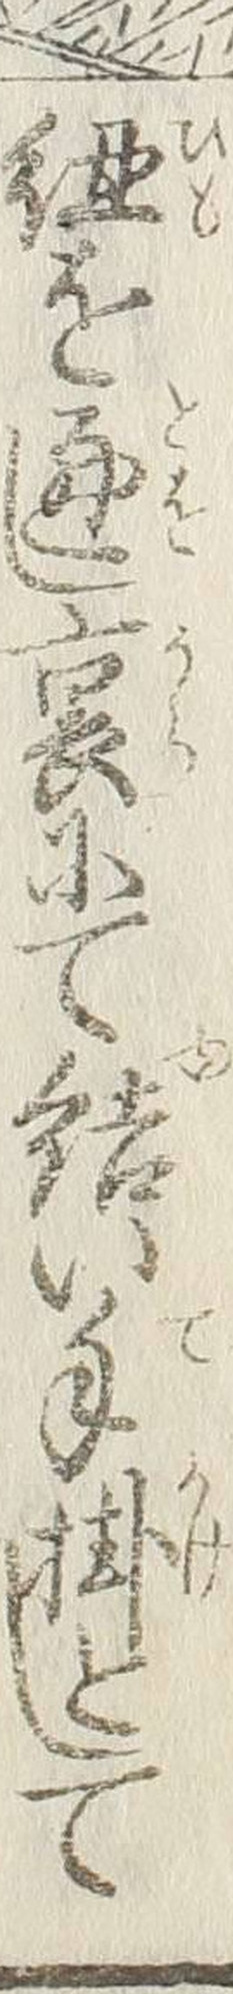紐を通し裏にて結い手掛として
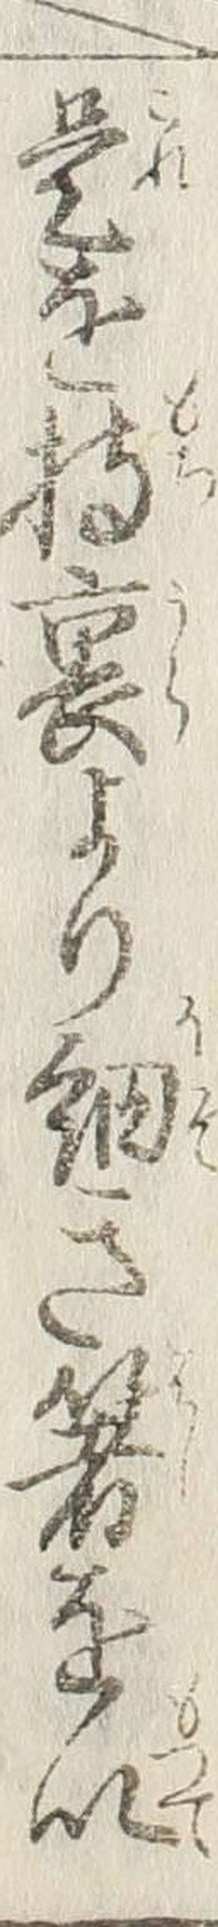是を持裏より細き箸を以
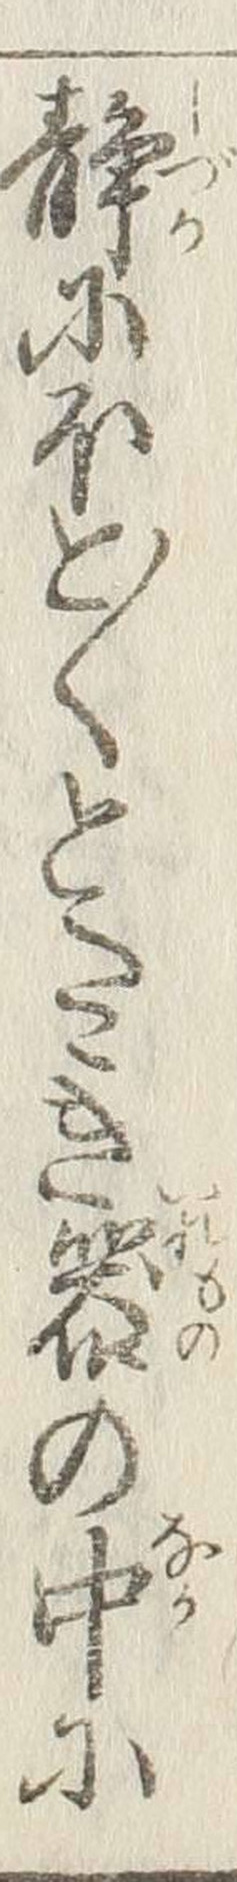静にほと〳〵とたゝき器の中に
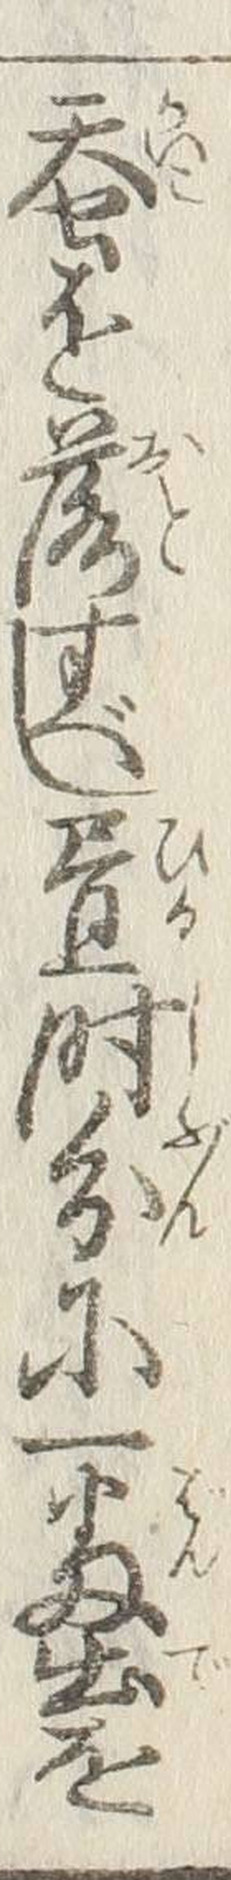蚕を落すべし昼時分に一番出を
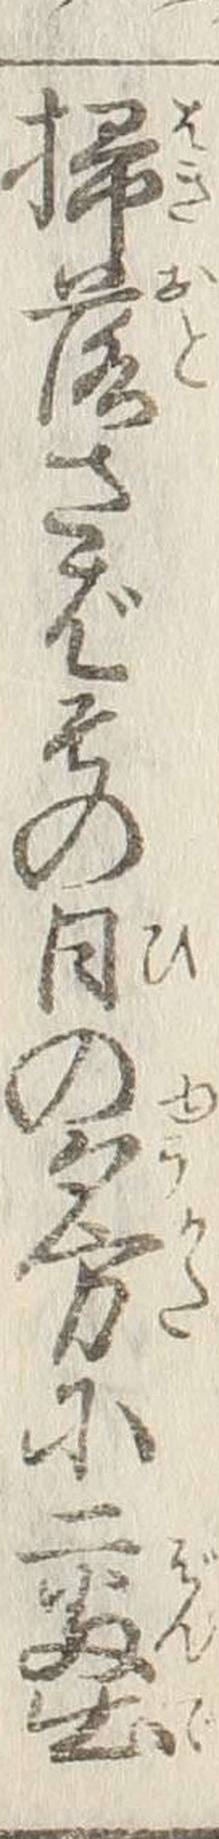掃落さばその日の夕方に二番出
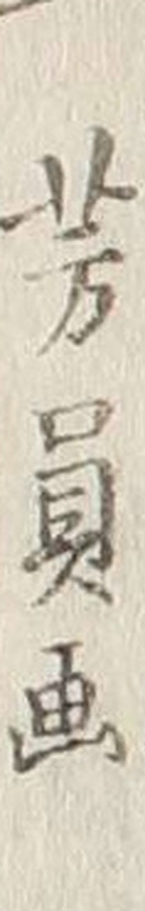芳員画
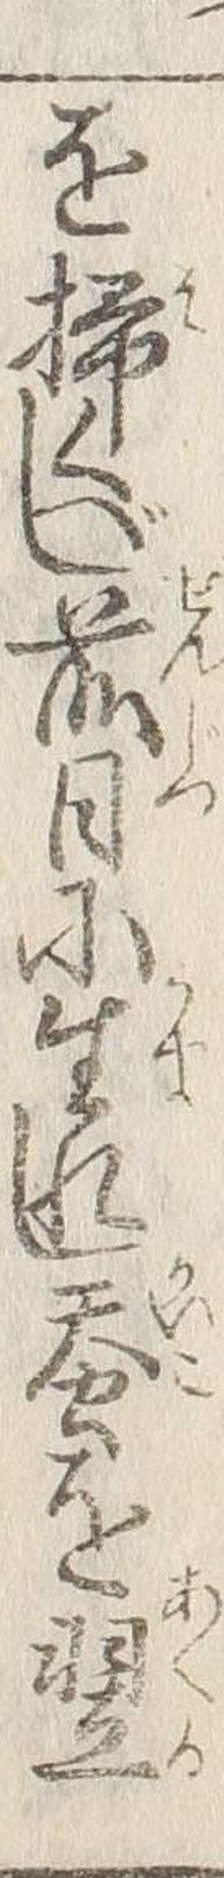を掃くべし前日に生れし蚕を翌

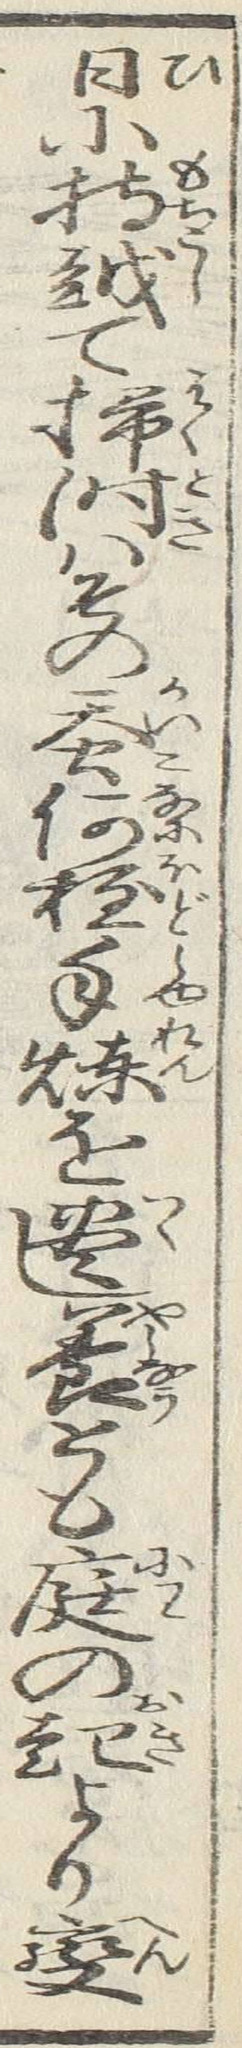日に持越て掃時はその蚕何程手煉を盡し養とも庭の起より變
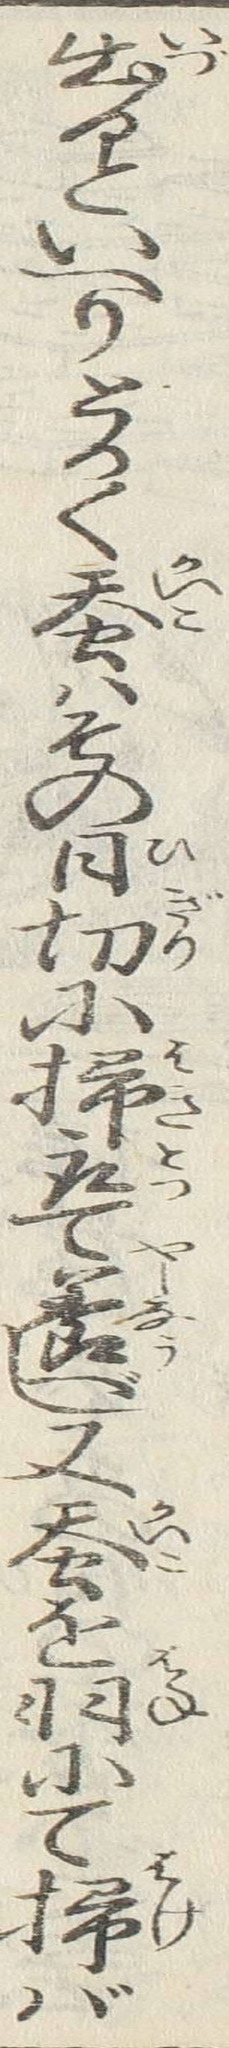出るといへりとかく蚕はその日切に掃取て養べし又蚕を羽にて掃ば
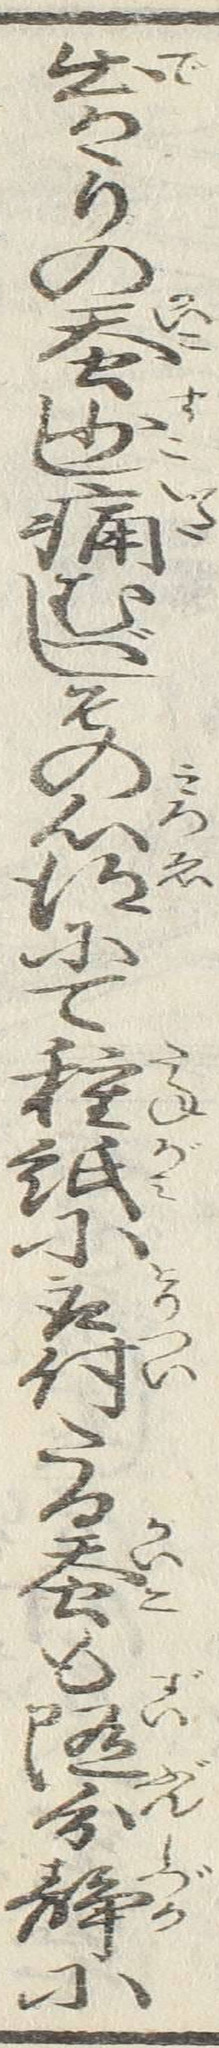出かゝりの蚕少し痛むべしその心得にて種紙に取付たる蚕も随分静に
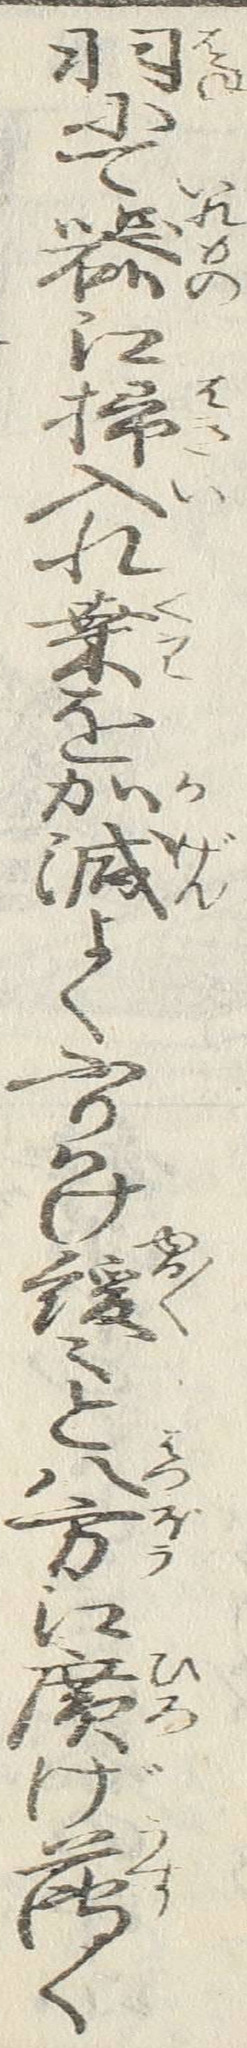羽にて器え掃入れ桑を加減よくふりかけ緩々と八方え廣げ薄く
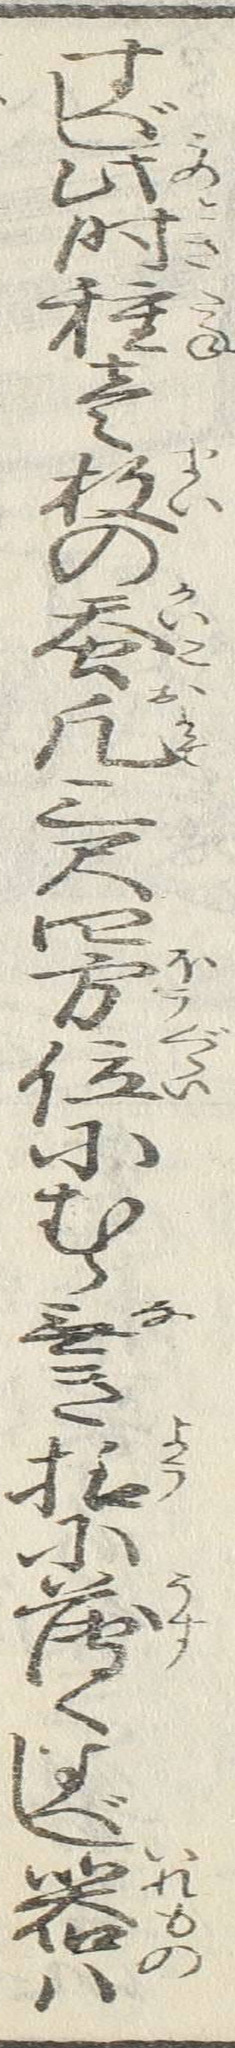すべし此時種壱枚の蚕凡三尺四方位にむら無き様に薄くすべし器は
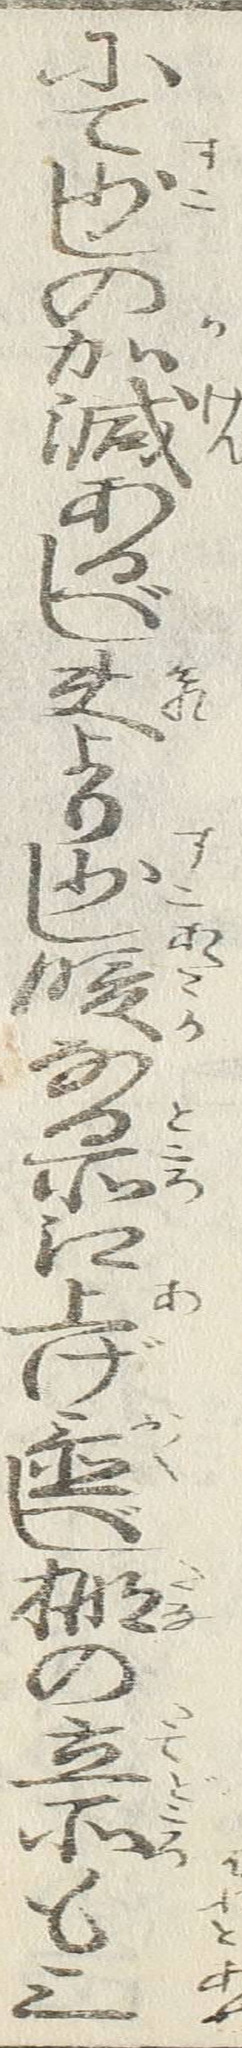にて少しの加減あるべし夫より少し暖なる所え上げ置べし棚の立所も三
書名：養蠶實驗録
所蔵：東京大学農学生命科学図書館 国文学研究資料館
